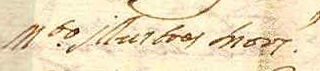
M.to Illustres Snors̄.
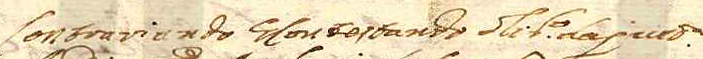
Contrariando E Contestando o lib.o da just.a
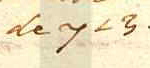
de 713.
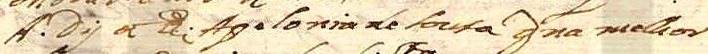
A. Dis a R. Apolonia de sousa q̄ na melhor
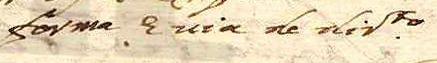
forma E uia de dir.to
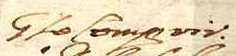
E se Comprir.
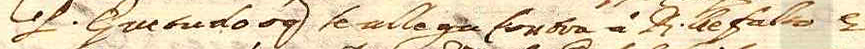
P. Que tudo o q̄ se allega Contra á R. he fallso E
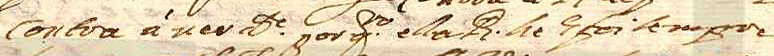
Contra á uerd̄.e. porq.to ela R. he E foi sempre
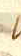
1
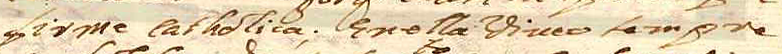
firme catholica; E nella Viueo sempre
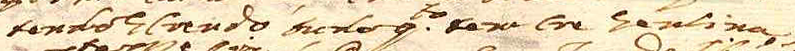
tendo E crendo tudo qt.o tem cre E ensina
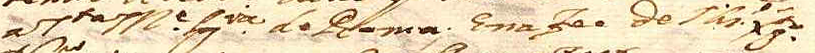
a sta Me. Igia. de Roma; E na fee de Ihs̄. xpt̄o.
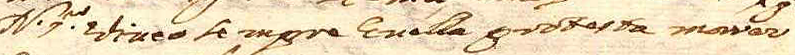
N. so.r E viueo sempre E nella protesta morrer
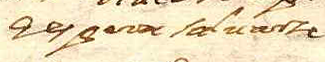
E espera saluarse
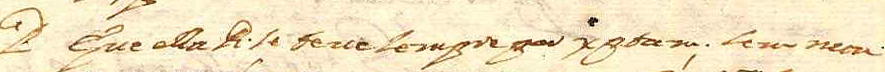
P Que ella R. se teue sempre por xptam; sem nun
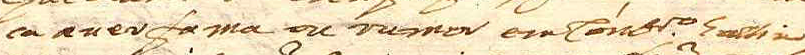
ca auer fama ou rumor em Contr.o E assim
